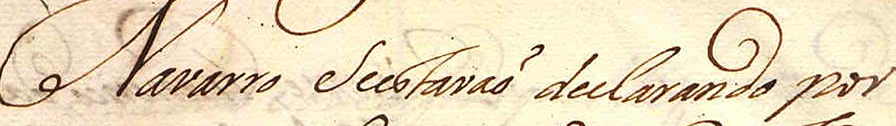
Navarro Se estavaõ declarando por
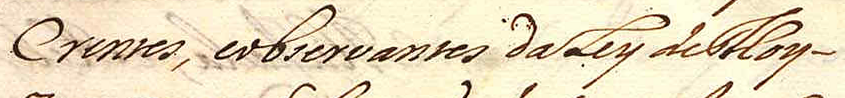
crentes, e observantes da Ley de Moy
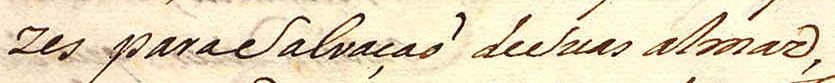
zes para Salvaçaõ de suas almaz,
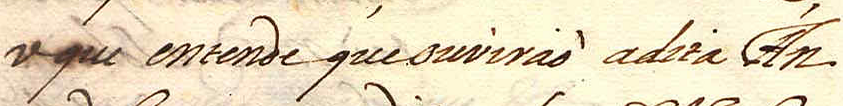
o que entende que ouviraõ a dita An
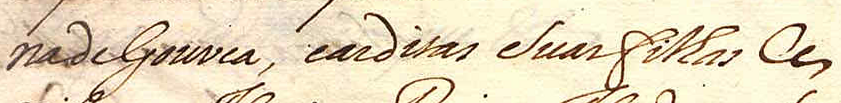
na de Gouvea, e as ditas suas filhas Ce
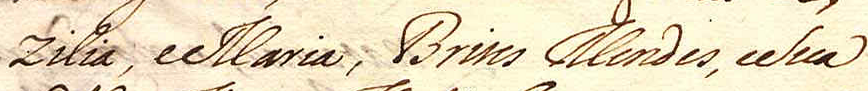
zilia, e Maria, Brites Mendes, e Sua
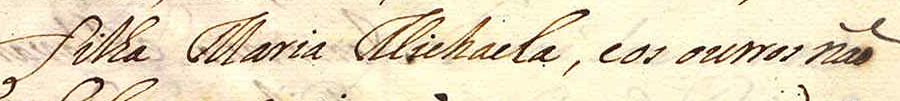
filha Maria Michaela, e os outros não
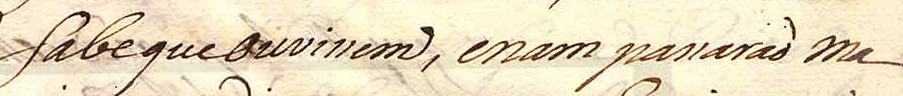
sabe que ouvissem, e nam passaraõ ma
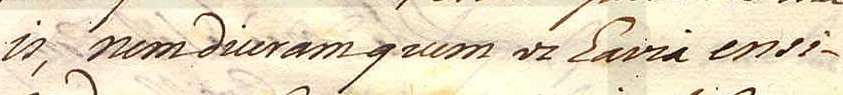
is, nem diceram quem os havia ensi
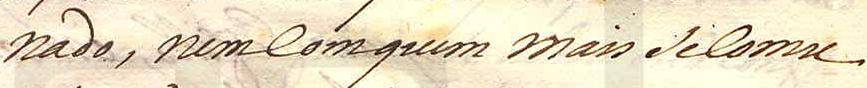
nado, nem com quem mais se comu
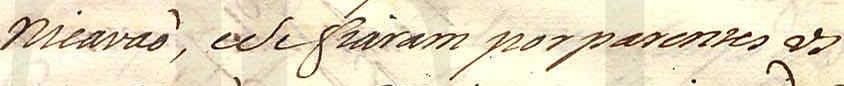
nicavaõ, e se fiaram por parentes os
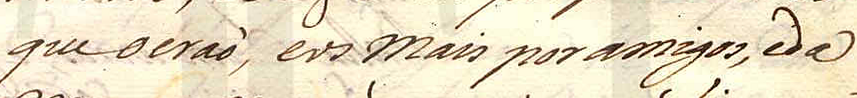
que o eraõ, e os mais por amigos, e da
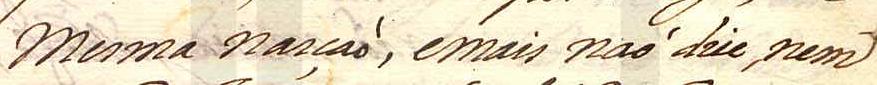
mesma nasçaõ, e mais naõ dice, nem
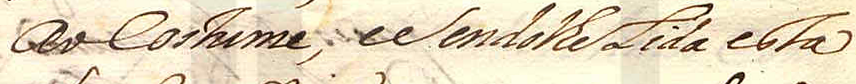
ao costume, e sendolhe Lida esta
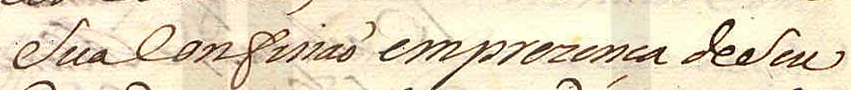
sua confissaõ em prezença de seu
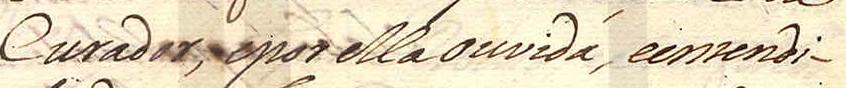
Curador, e por ella ouvida, e entendi
